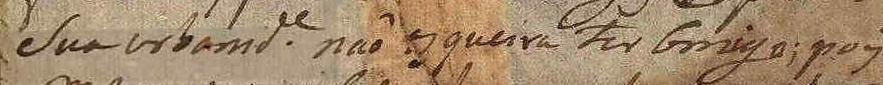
sua urbanid.e naõ os queira ter Comigo; pois
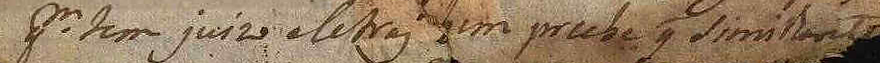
q.m tem juizo; e letras bem prcebe q̄ similhante
